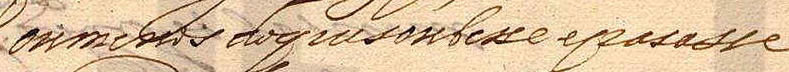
ou menos do que soubesse e pasasse
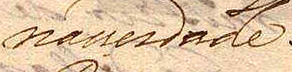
na uerdade.
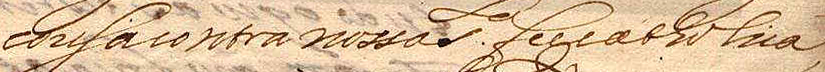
cousa contra nossa s.ta fee catholica,
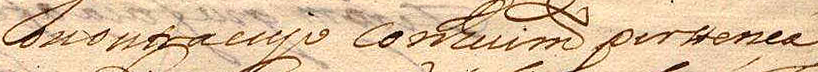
ou outra cujo conhecimto perttença
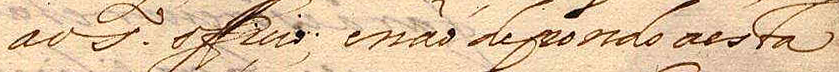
ao sto officio; e não depondo a esta
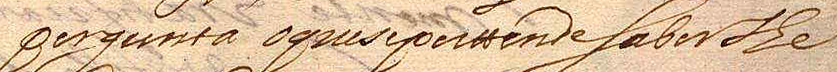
pergunta o que se perttende saber lhe
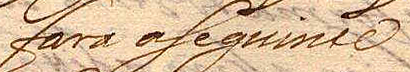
fara o seguinte
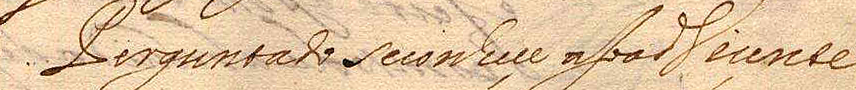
3. Perguntado se conheçe a Joaõ Viçente
